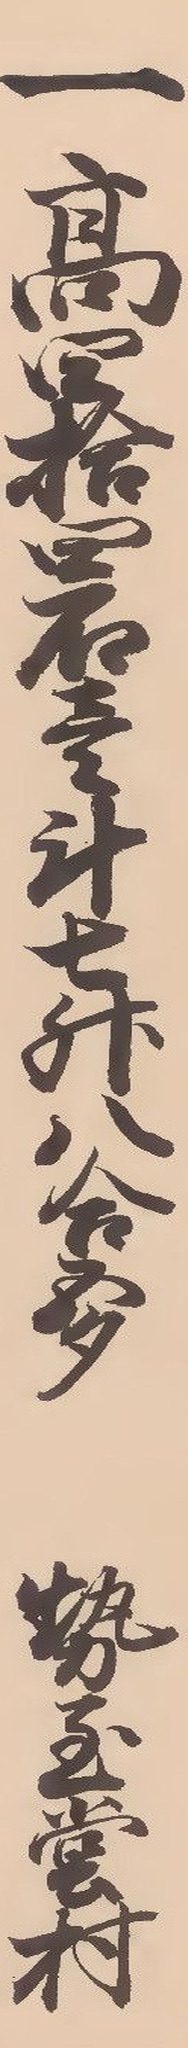一高四拾四石壱斗七升八合五勺勢至堂村
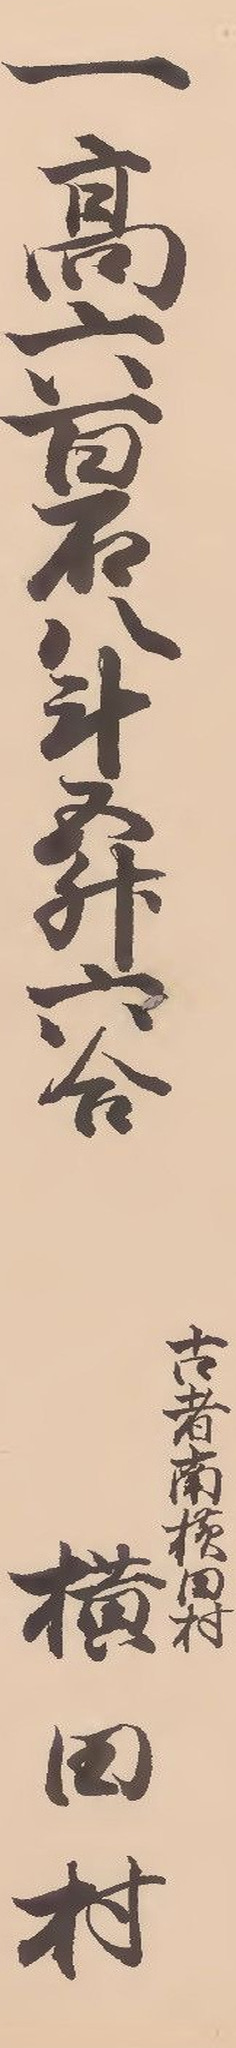一高六百石八斗五升六合横田村
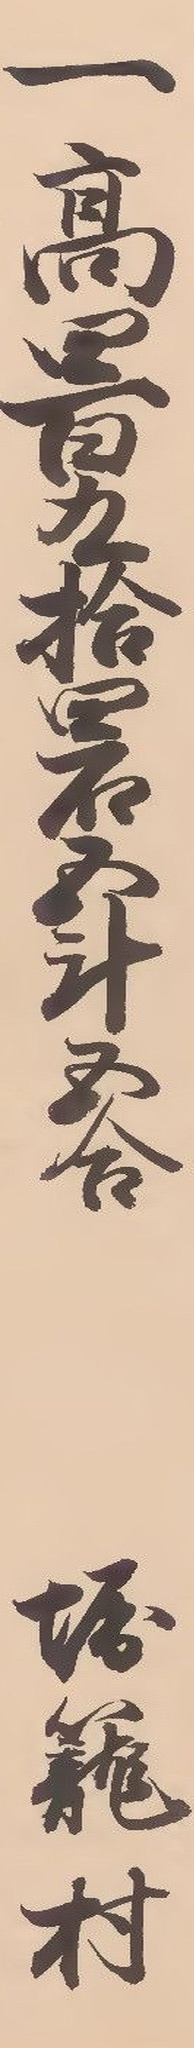一高四百九拾四石五斗五合堀篭村
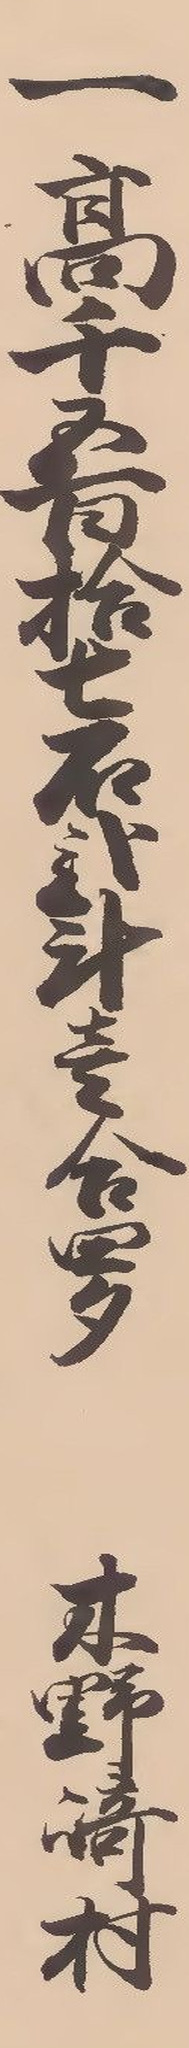一高千五百拾七石弐斗壱合四勺木野崎村
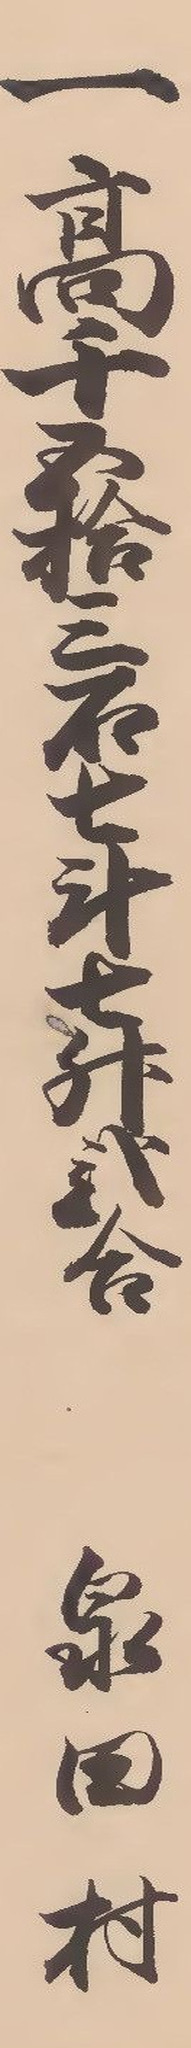一高千五拾三石七斗七升弐合泉田村
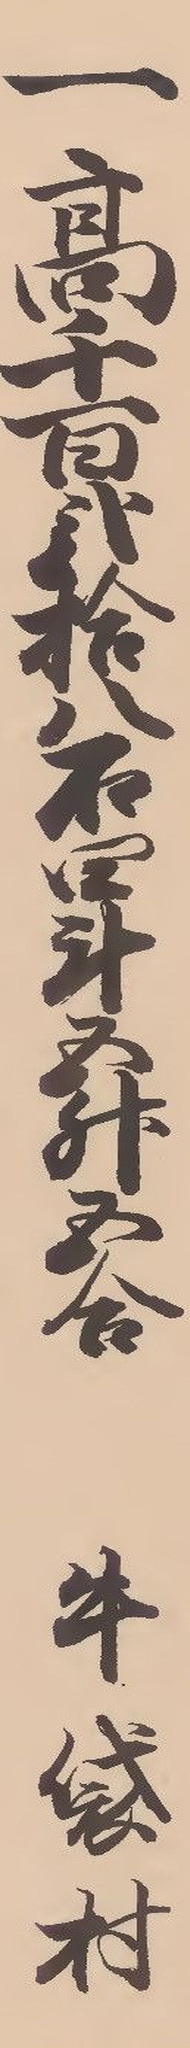一高千百弐拾八石四斗五升五合牛袋村
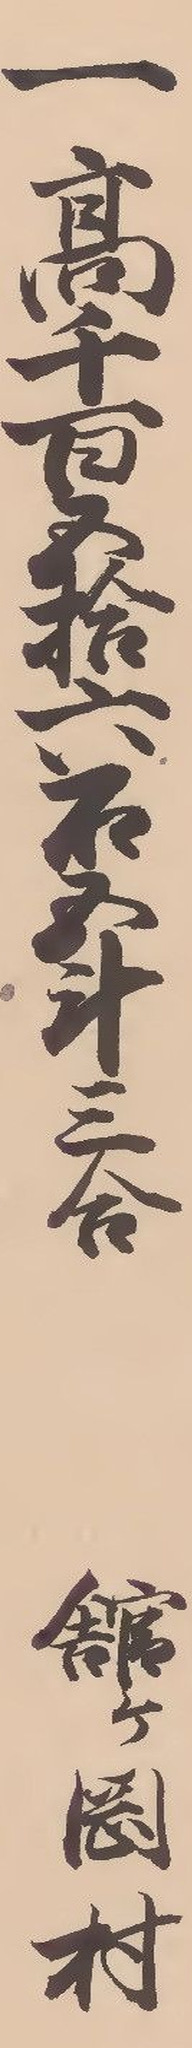一高千百五拾六石五斗三合館ヶ岡村

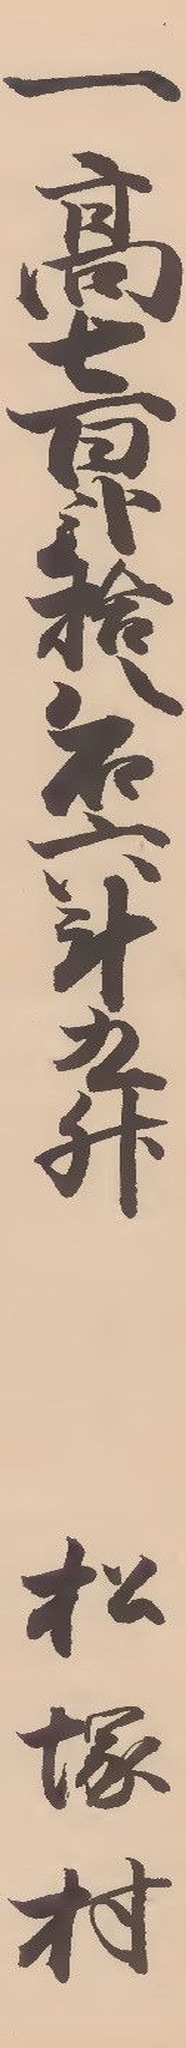一高七百弐拾八石六斗九升松塚村
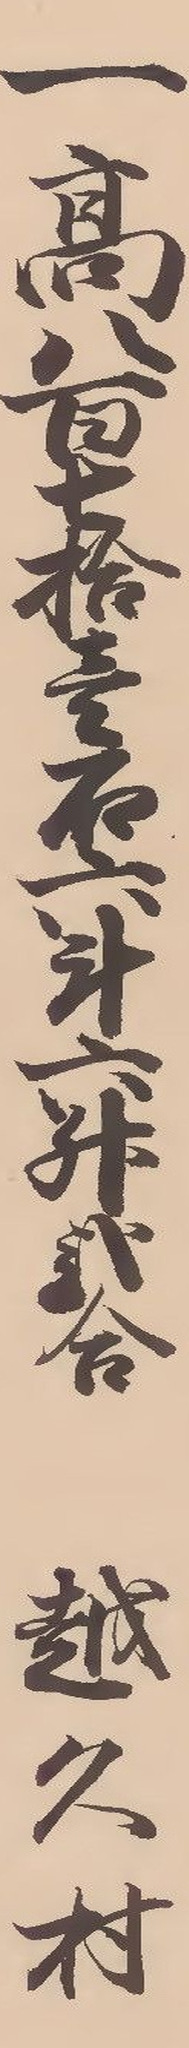一高八百七拾壱石六斗六升弐合越久村
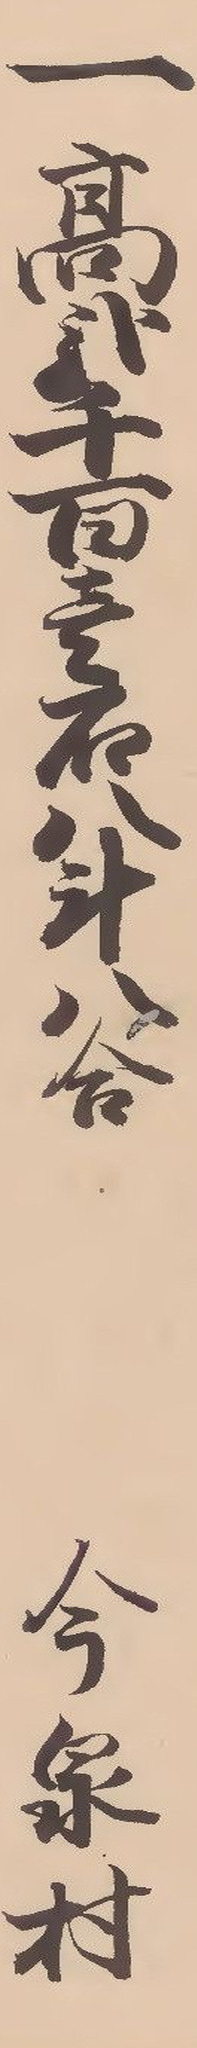一高弐千百壱石八斗八合今泉村
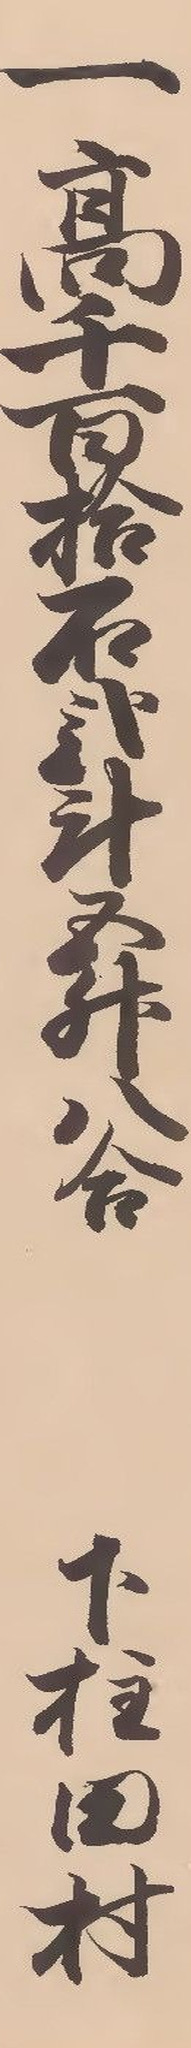一高千百拾石弐斗五升八合下柱田村
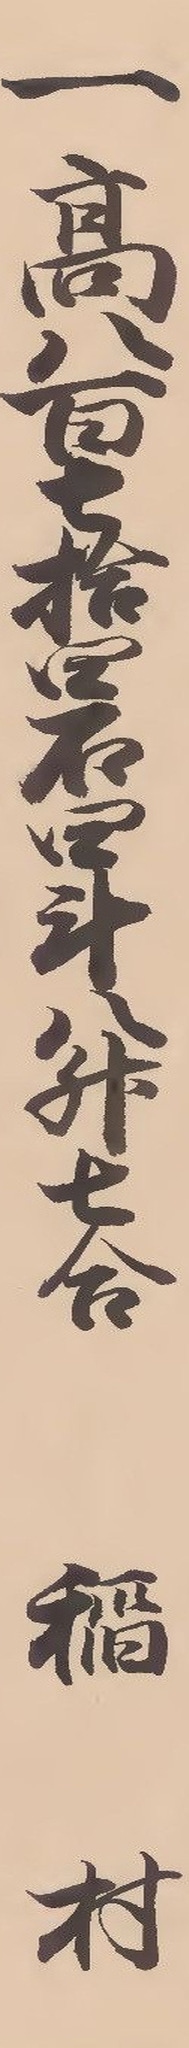一高八百七拾四石四斗八升七合稲村
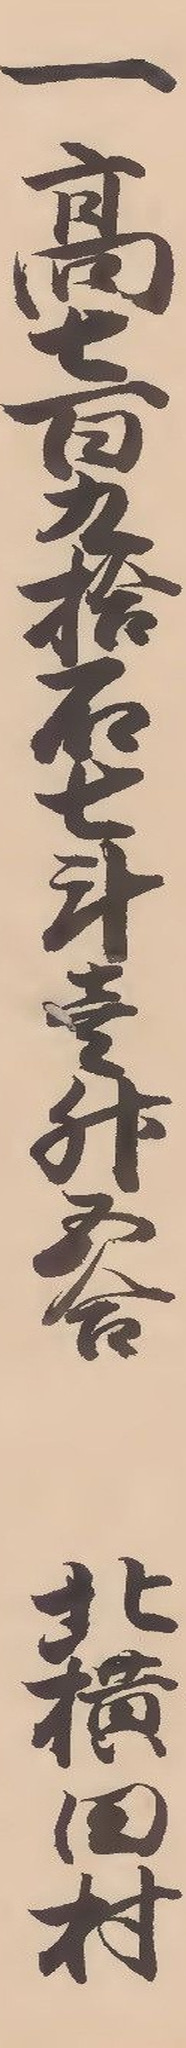一高七百九拾石七斗壱升五合北横田村
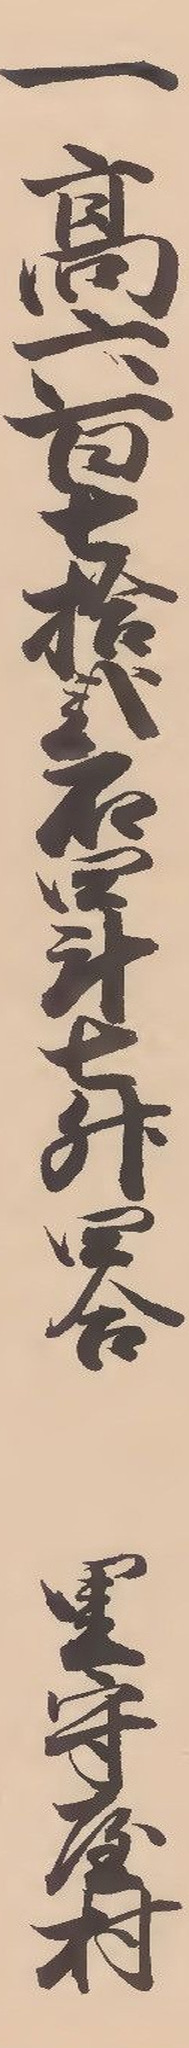一高六百七拾弐石四斗七升四合里守屋村
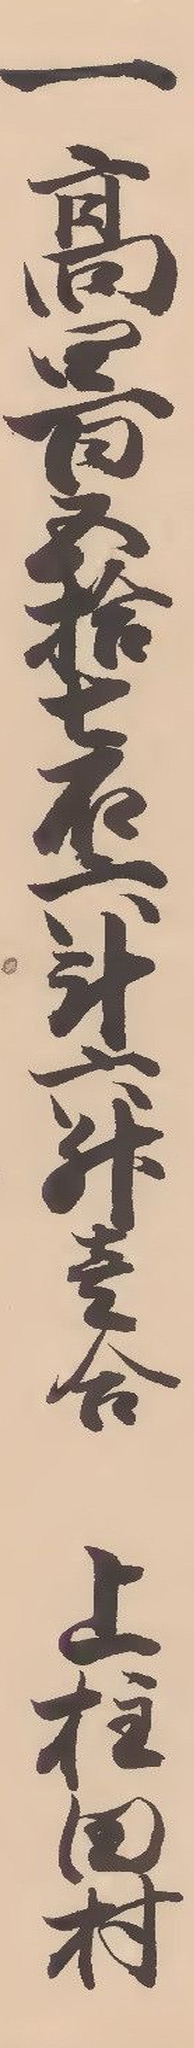一高四百五拾七石六斗六升壱合上柱田村

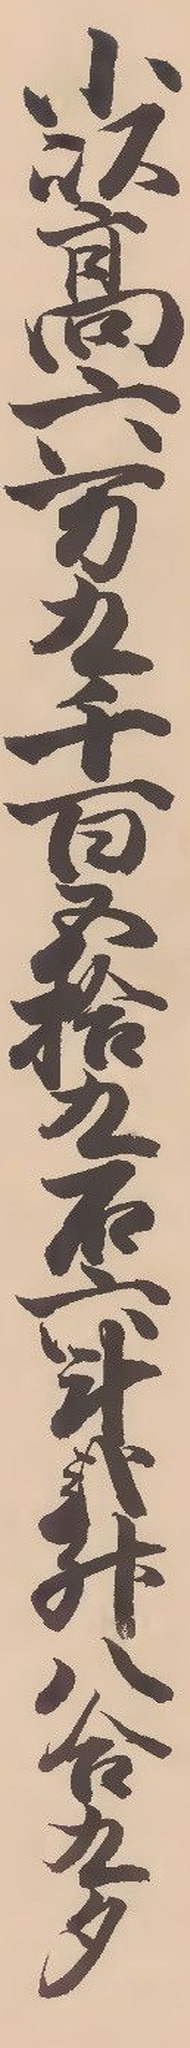小以高六万九千百五拾九石六斗弐升八合九勺
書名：陸奥国郷帳　２
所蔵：国立公文書館 National Archives of Japan
